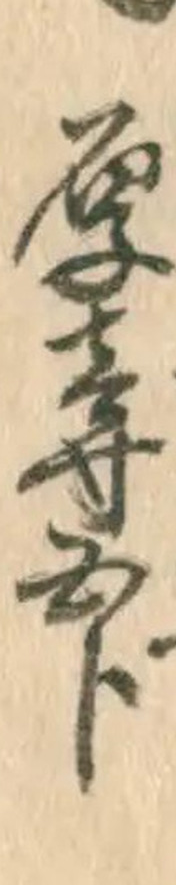厚壱寸五分
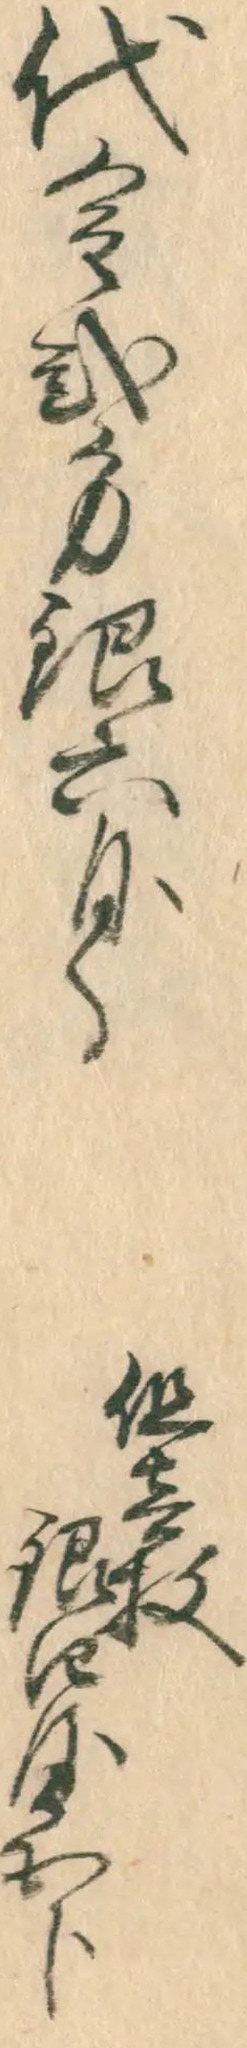代金弐分銀六匁但壱枚銀四匁五分
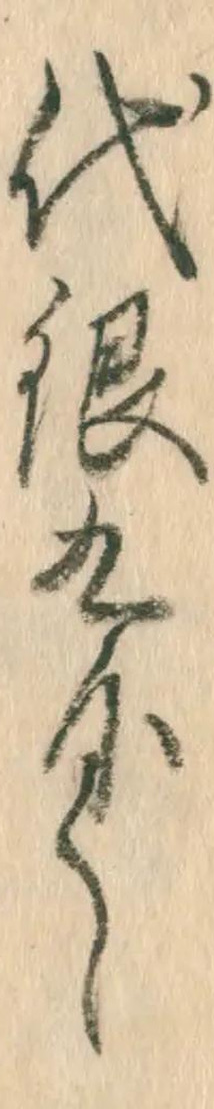代銀五匁
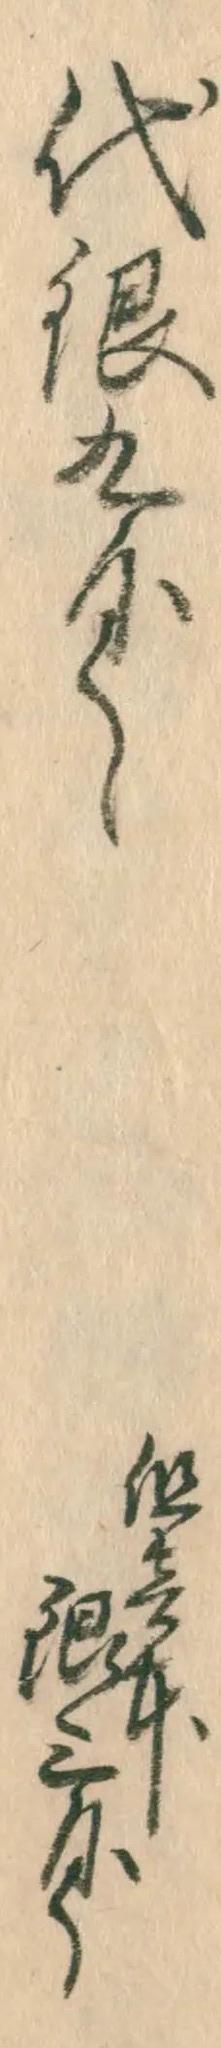代銀九匁但壱本銀三匁
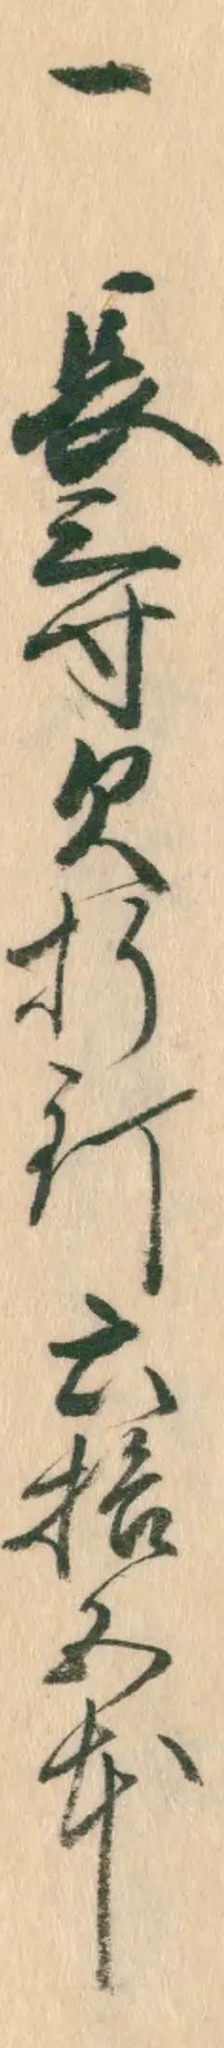一長三寸欠折釘六拾五本
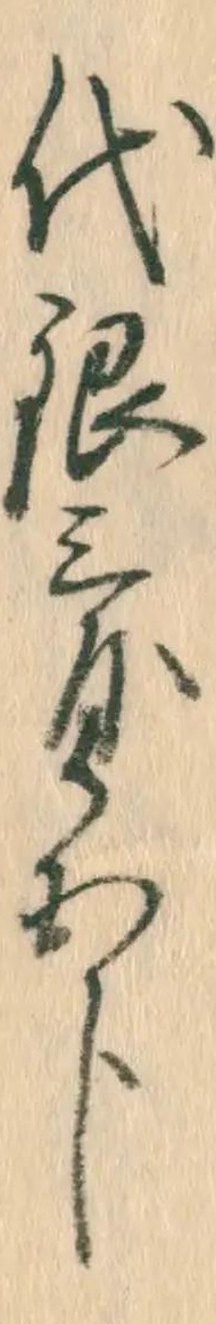代銀三匁五分
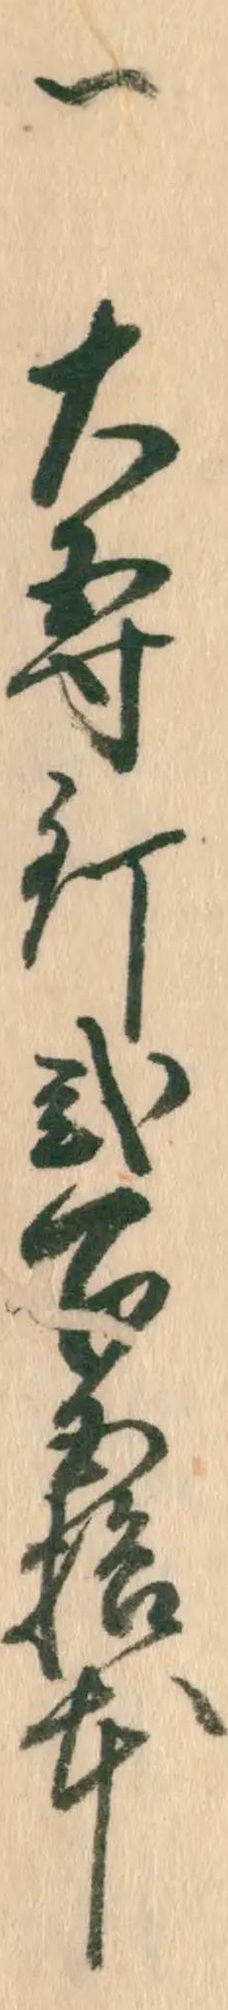一大五寸釘弐百五拾本
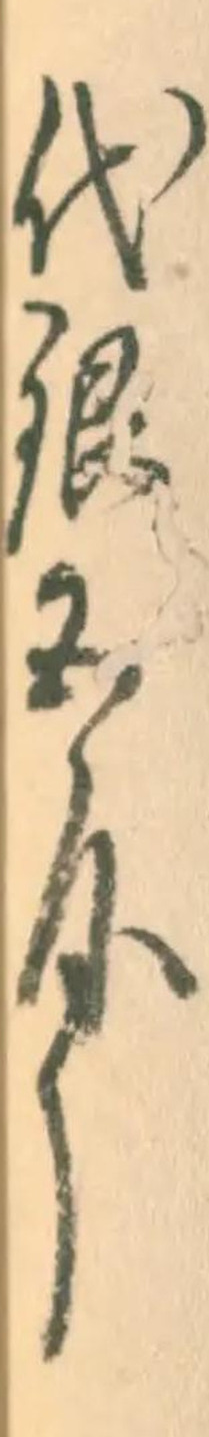代銀五匁
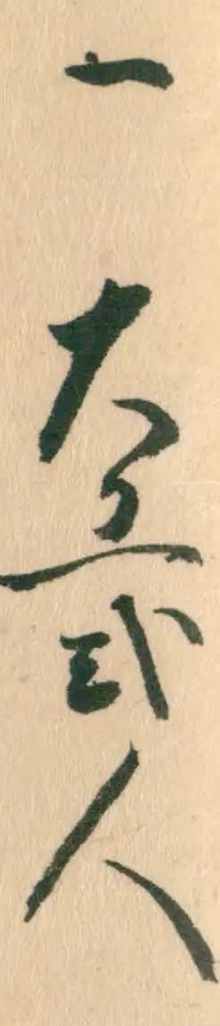一大工弐人
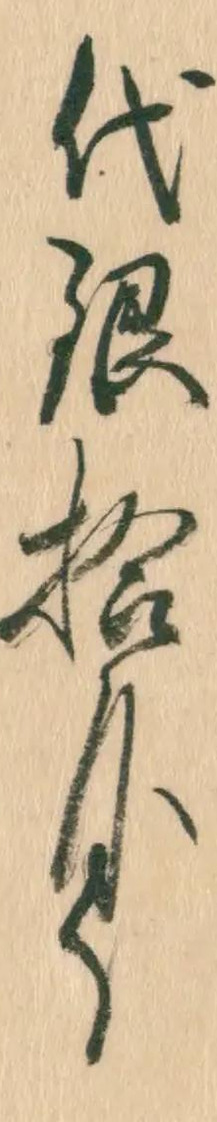代銀五匁
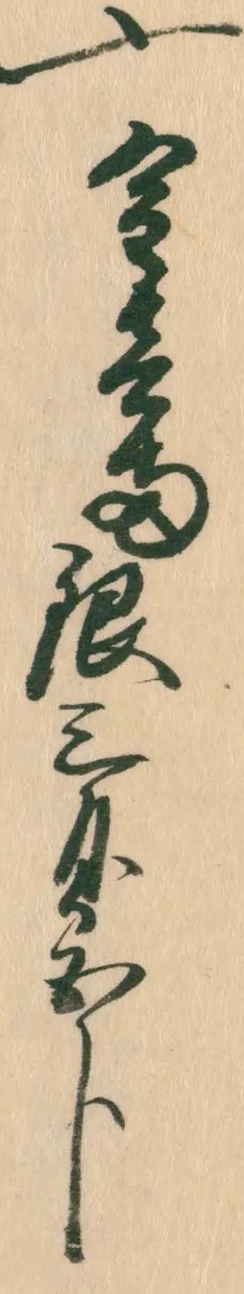〆金壱両銀三匁五分
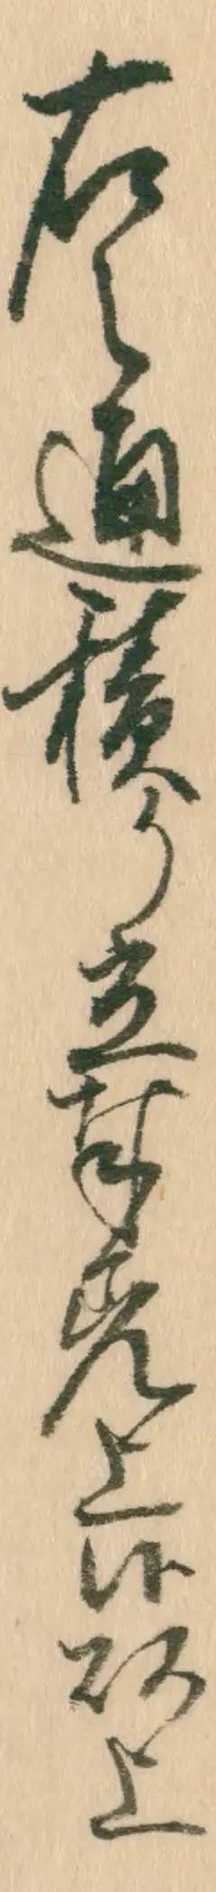右之通積り立奉差上候以上
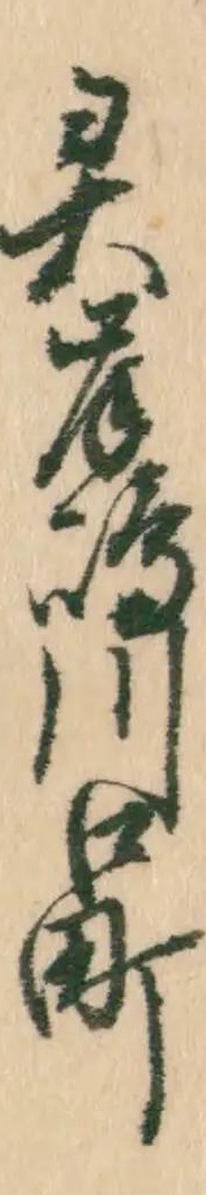卯霊岸島川口町

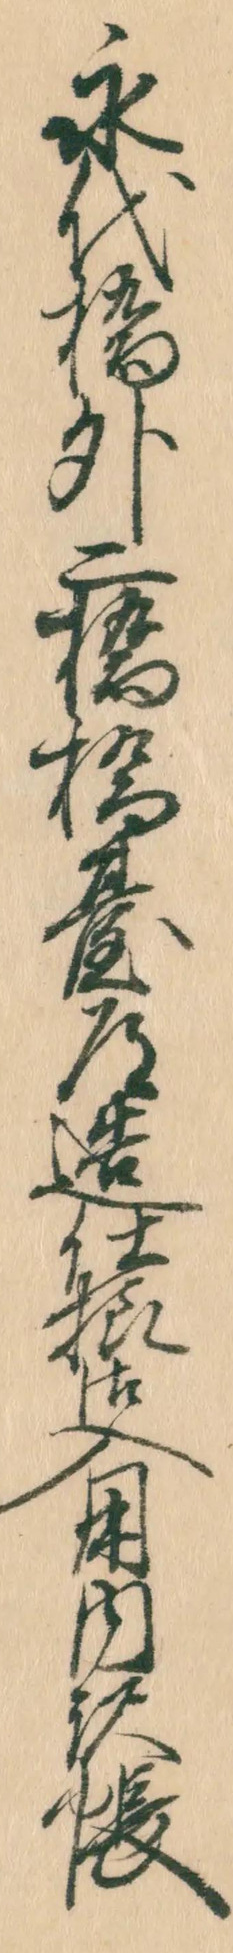永代橋外二橋橋台道造仕様御入用内訳帳

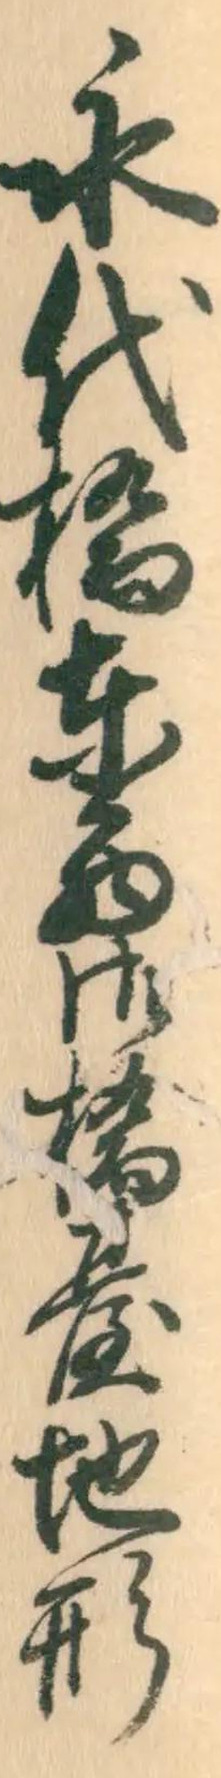永代橋東西御橋台地形
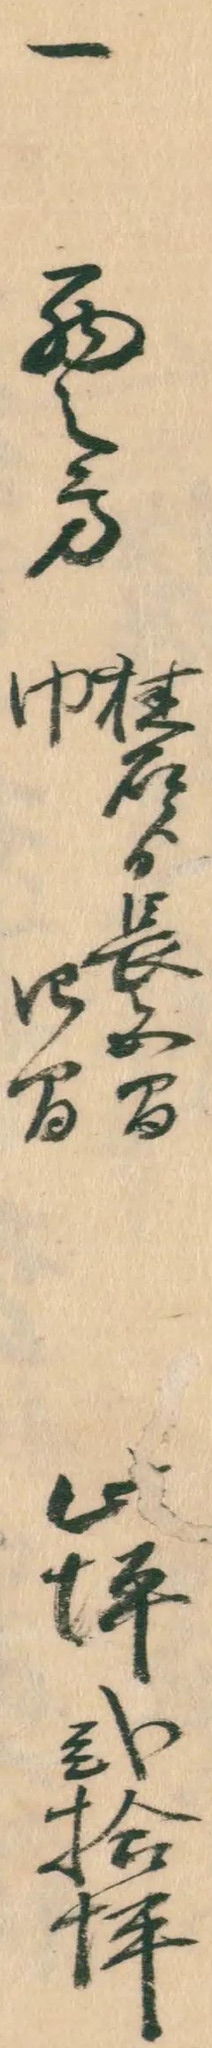一西之方桂石ゟ長五間此坪弐拾坪
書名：三橋 17巻. [8] 三橋小破御修復書留　但御奉行御掛リ替地震潰橋番屋　嘉永四亥年より安政二卯年迄　下
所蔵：国立国会図書館 National Diet Library, JAPAN
